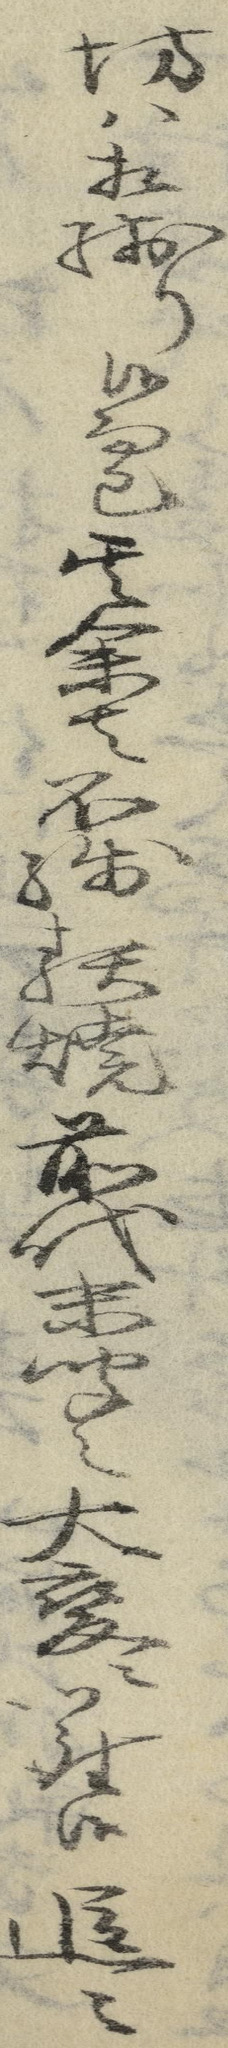坊ハ相残り候而も其余者不残類焼前代未聞之大変ニ御座候追ゝ
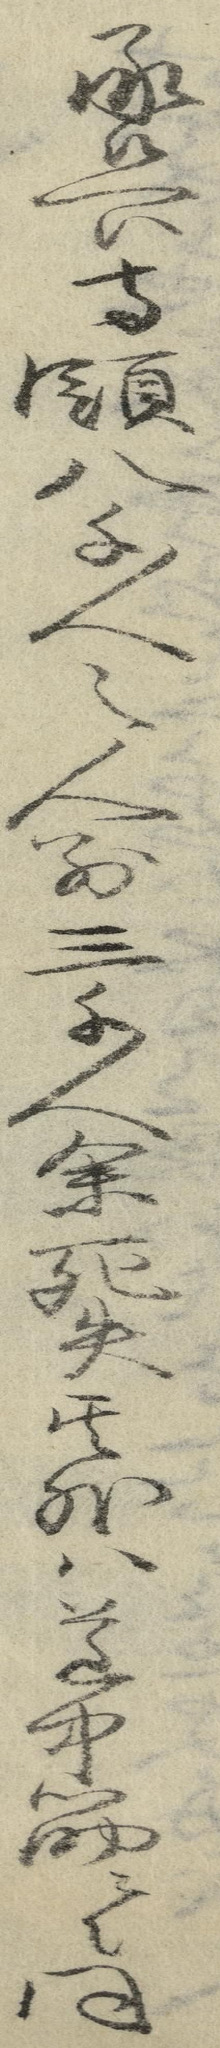承候ヘハ寺領八千人之人別三千人余死失其外ハ道中筋ニも同
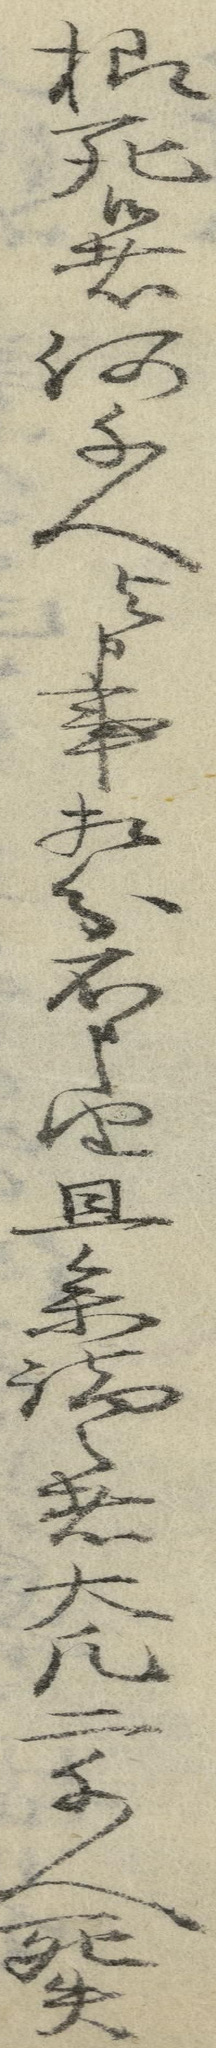様死候者何千人と申事相分不申由且参詣者大凡二千人死失
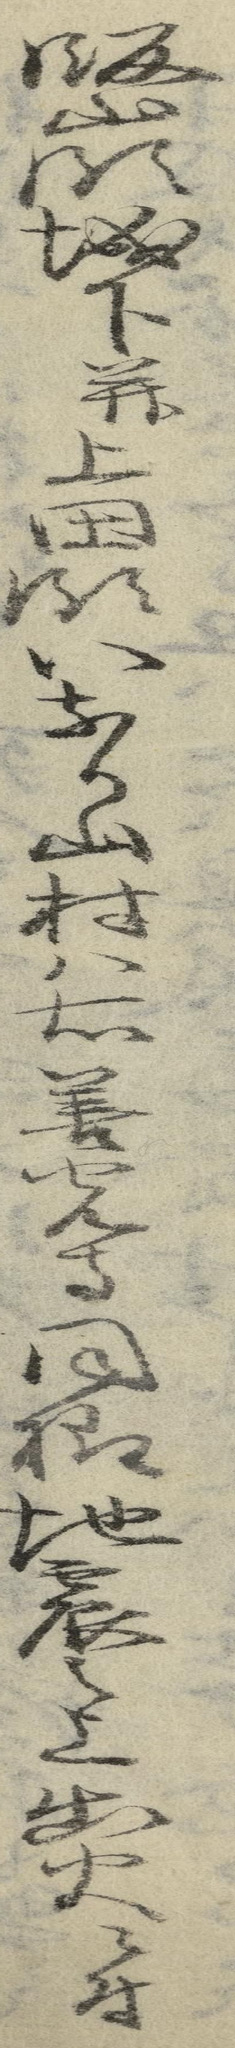一阪山領城下幷上田領いなり山村ハ右善光寺同様地震之上出火ニ付
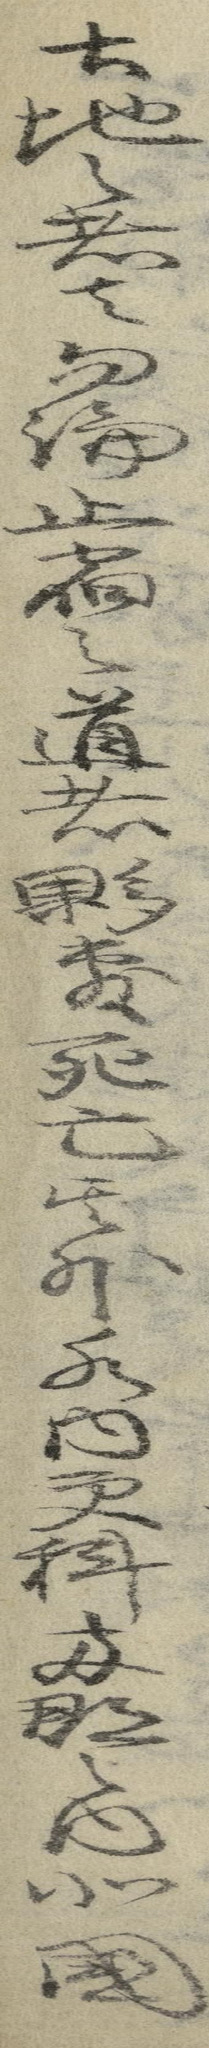右地之者は勿論止宿之道者夥敷死亡其外水内更科両郡之内北国

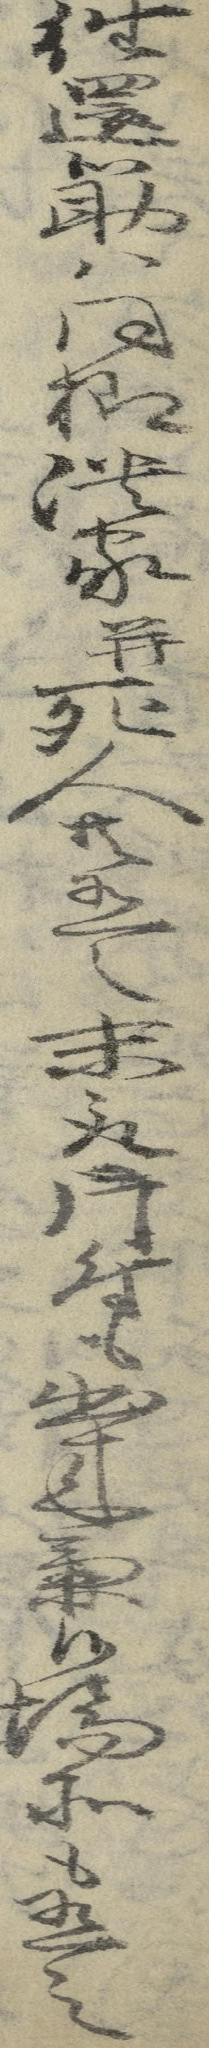往還筋ハ同様潰家幷死人共有之末取片付も出来兼候場所も有之
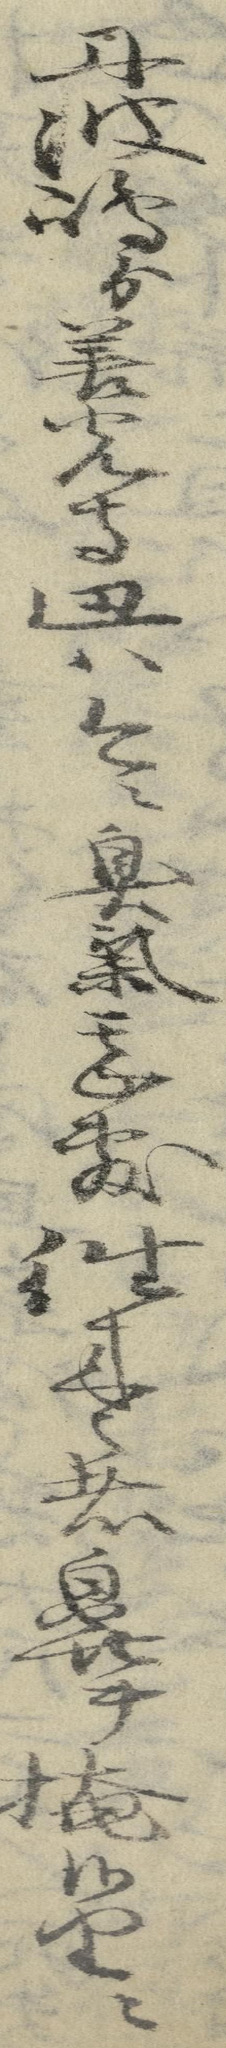丹波嶋ゟ善光寺辺ハ今ニ臭氣甚敷往来の者鼻ヲ掩候由ニ
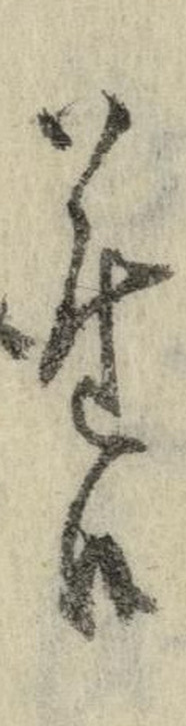御座候
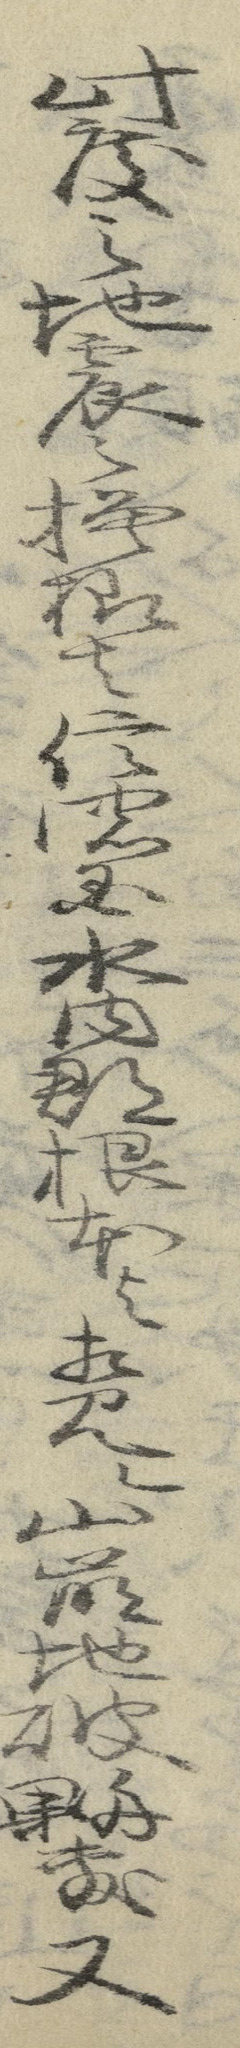一此度之地震之模様者信濃国水内郡根本と相見シ山崩地破夥敷又
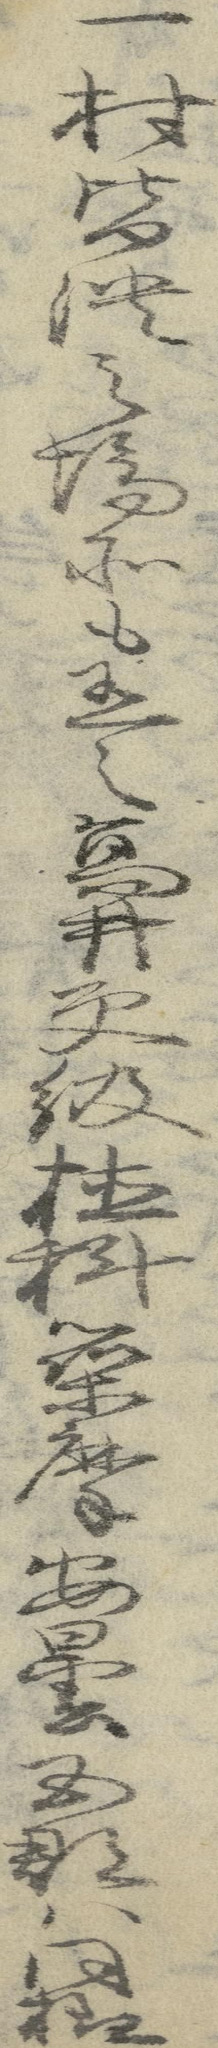一村皆潰之場所も有之高井更級植科築摩安曇五郡ハ同様
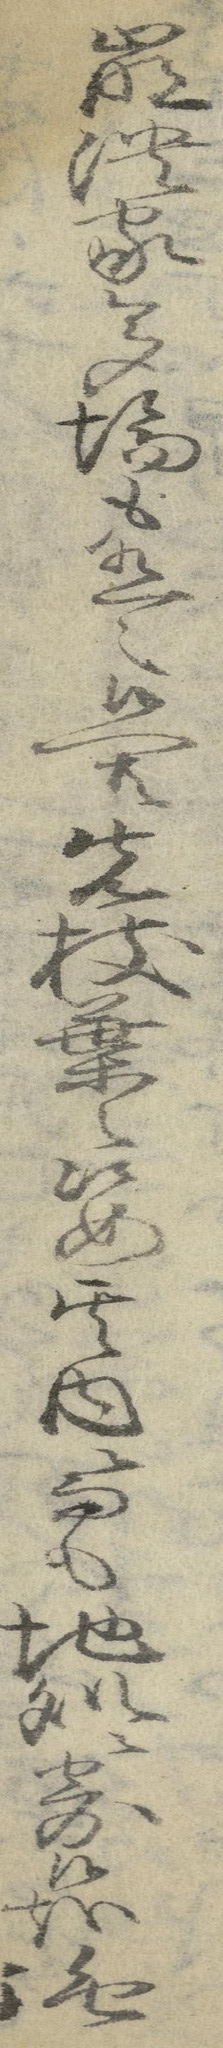崩潰家多場も有之候へ共先枝葉之姿其内二而も地処二寄候哉強
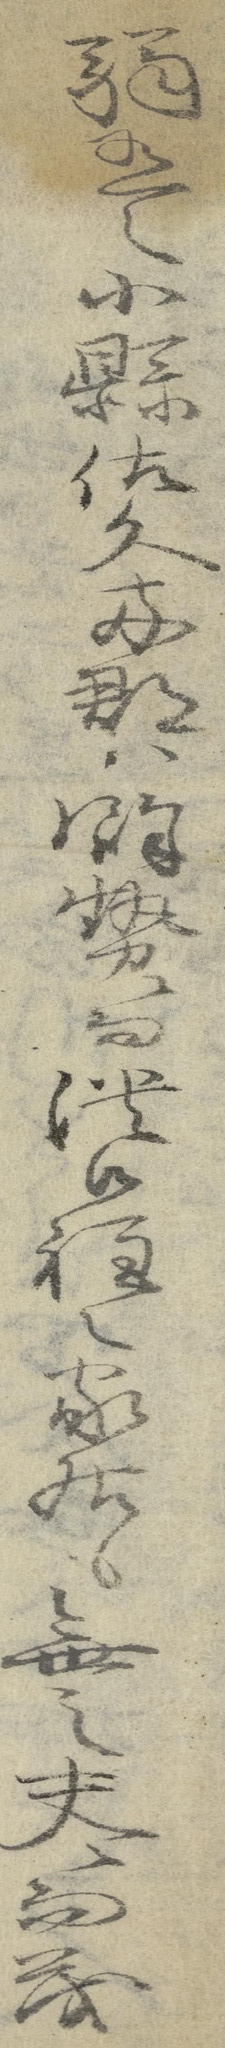弱有之小縣佐久両郡ハ余㔟二而潰候程之家居も無之夫二而も
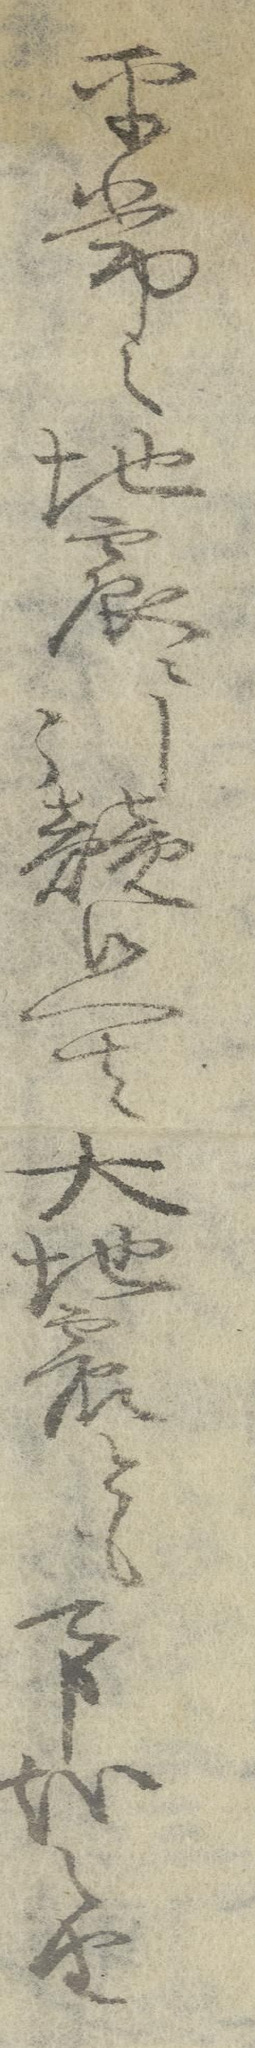平常之地震ニ引競候へ者大地震とも可申哉之由
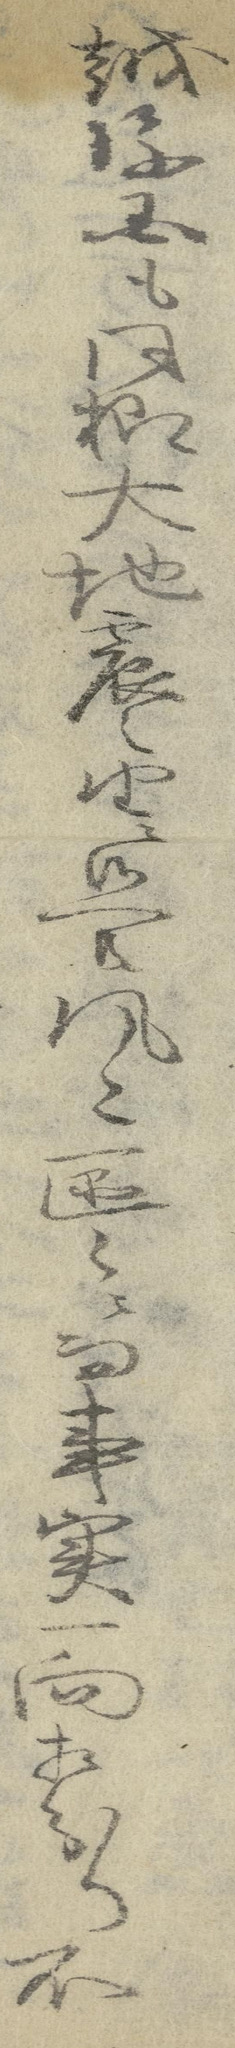一越後国も同様大地震之由二候へ共間々區々二而事実一向相分り不

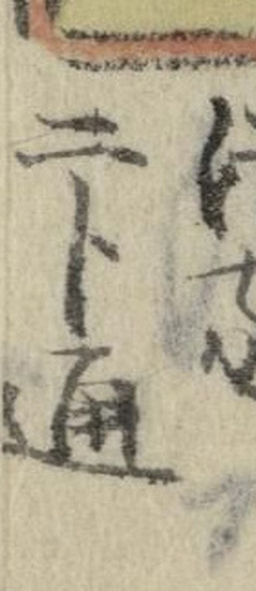二分通
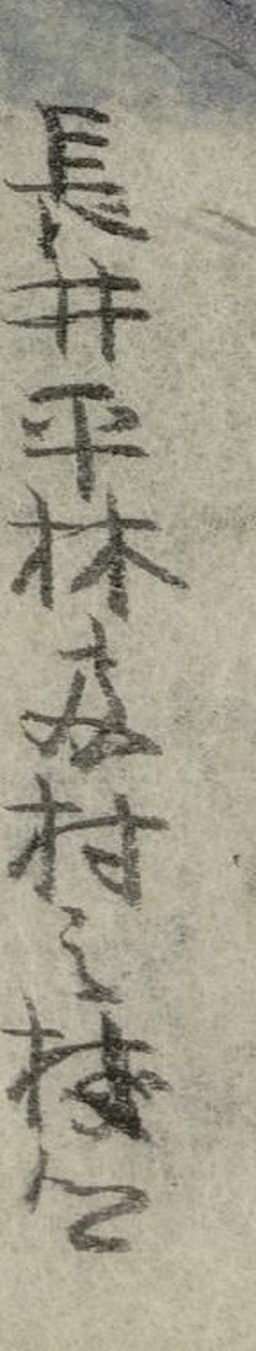長井平林両村之村郷
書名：[善光寺地震被害書上]
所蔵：東京大学地震研究所図書室 Earthquake Research Institute Library, The University of Tokyo, JAPAN
